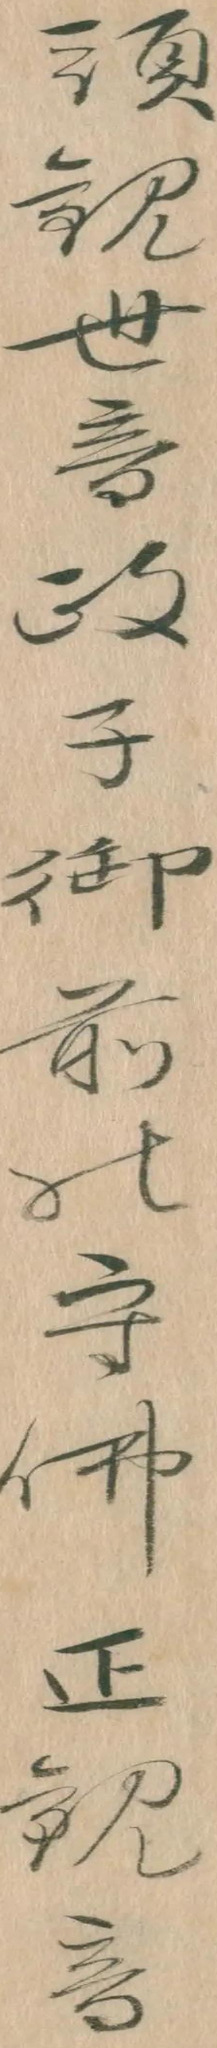頭観世音政子御前の守仏正観音
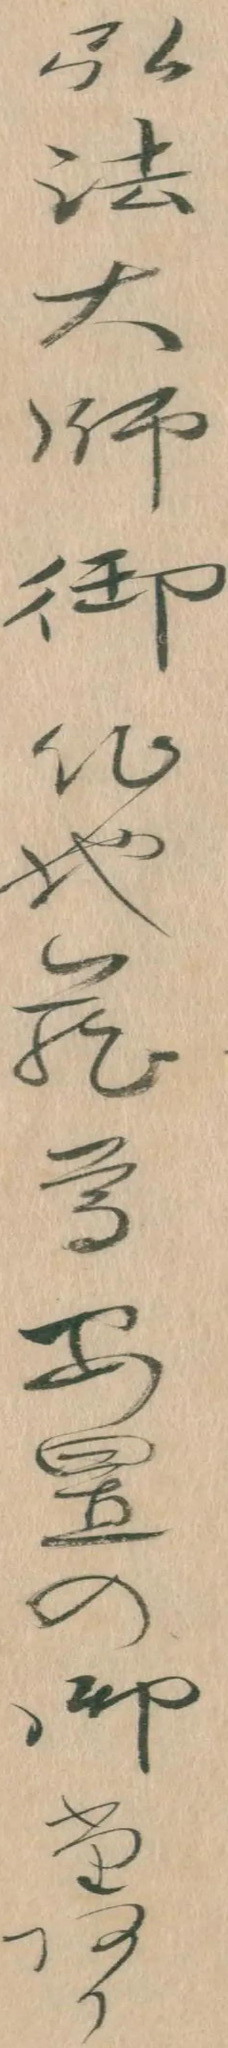弘法大師御作地蔵尊安置の御堂あり
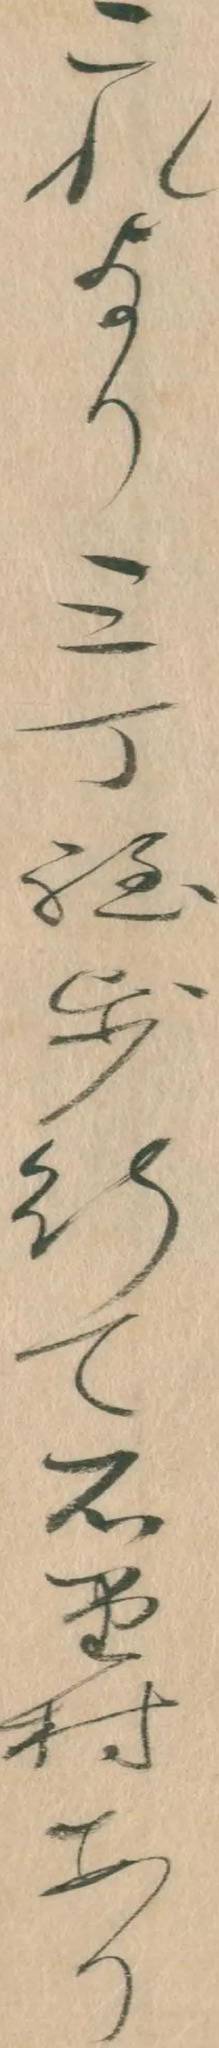これより三丁程歩行て石堂村あり
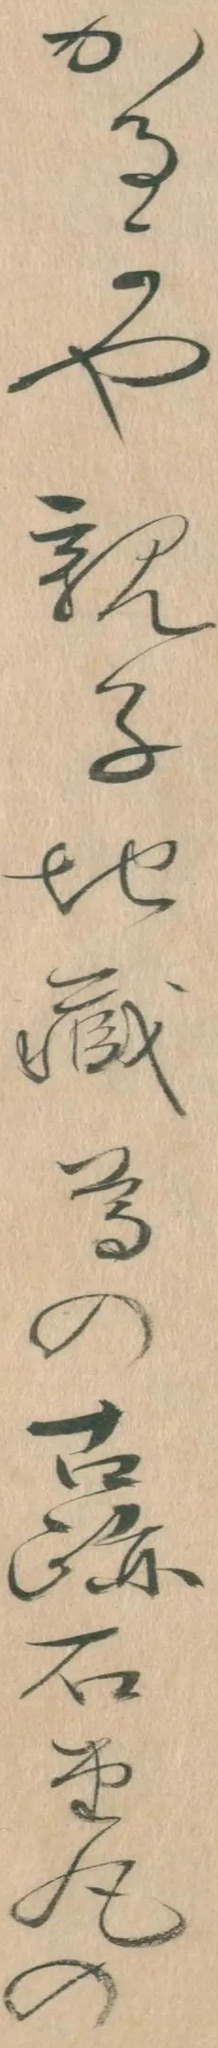かるかや親子地蔵尊の古跡石堂丸の
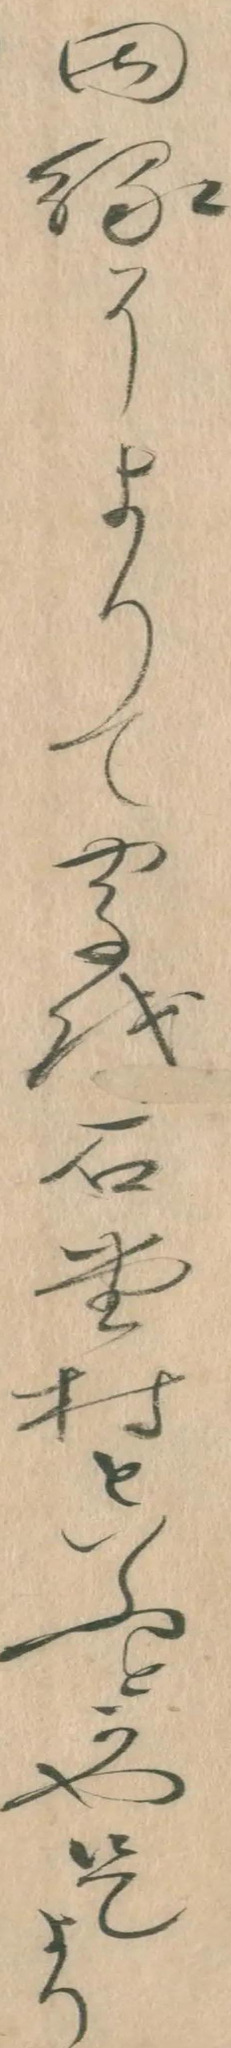因縁によりて字を石堂村といふとかや是より
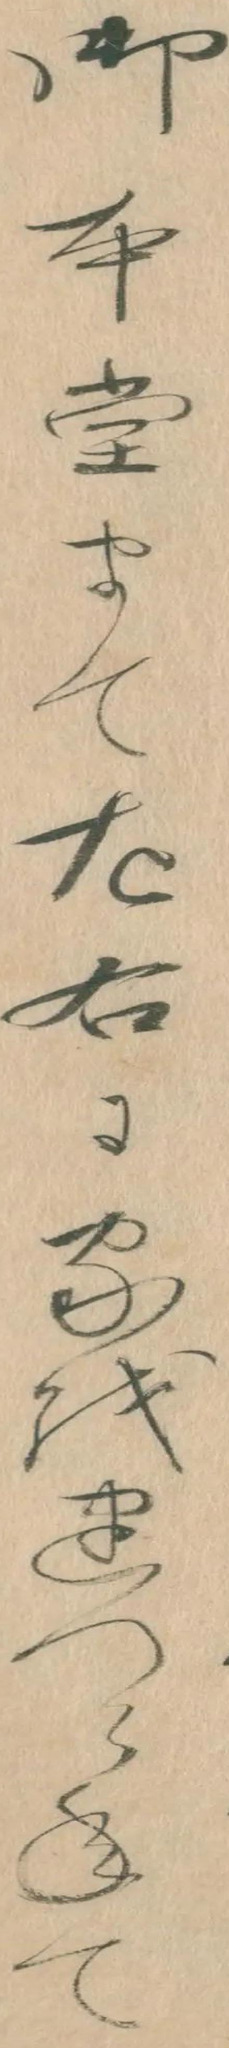御本堂まて左右に家を建つらねて

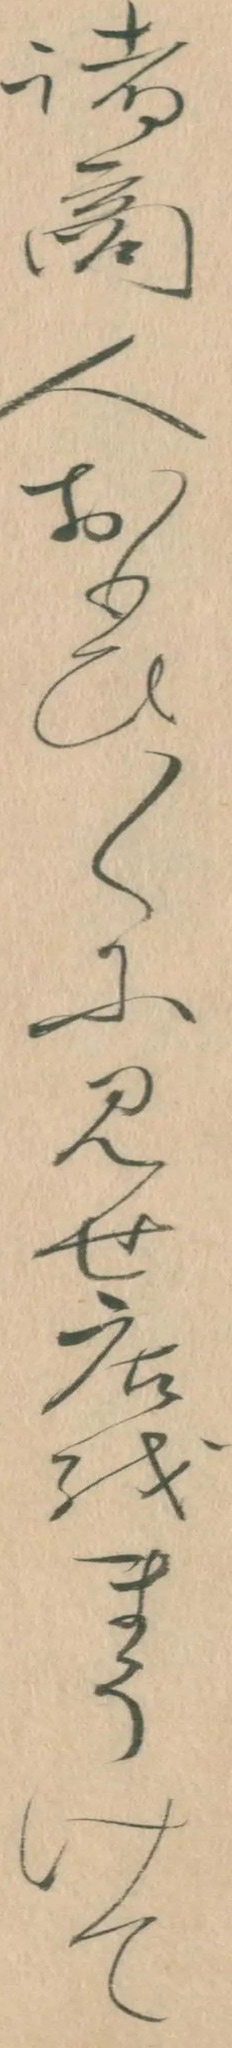諸商人おもひ〳〵に見せ店をまうけて
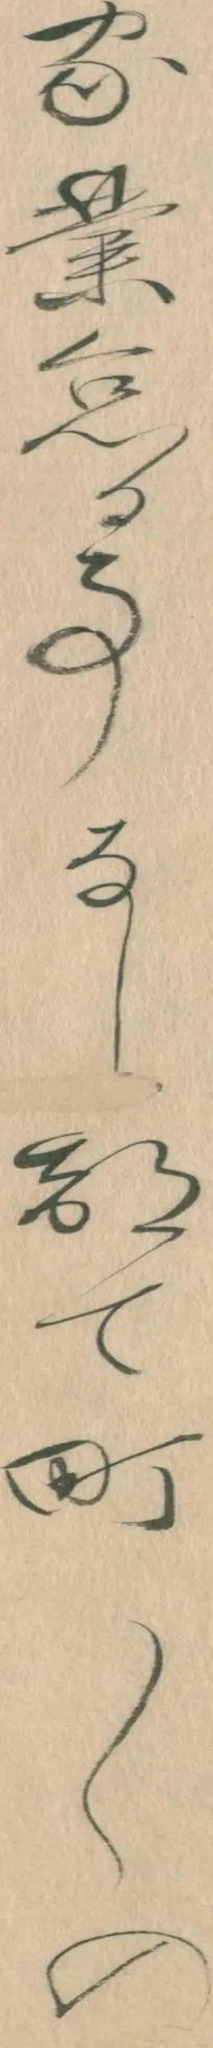家業怠る事なし都て町〳〵の
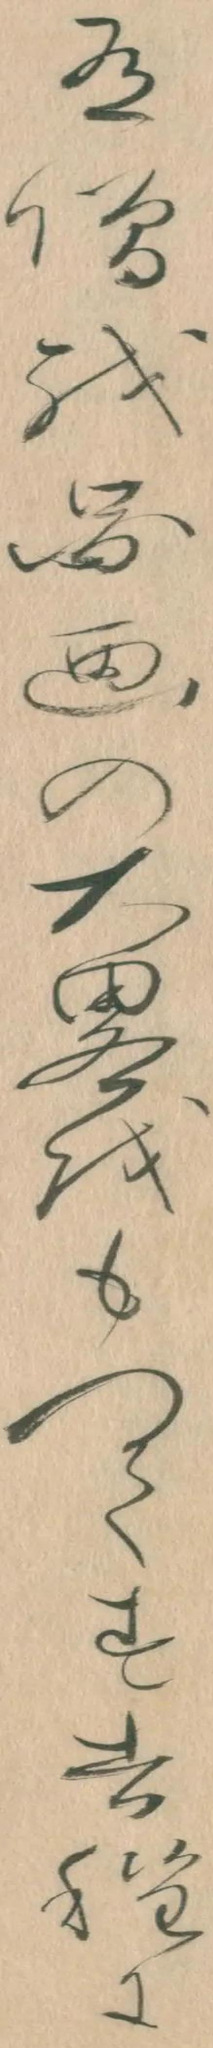有増を図画の大略をもつてす先程に
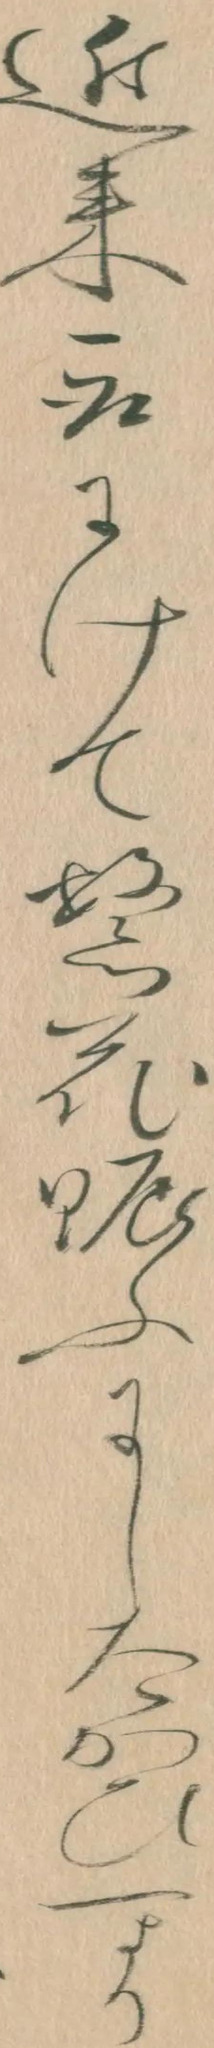近来取にけて繁花賑ふにしたかひ一より
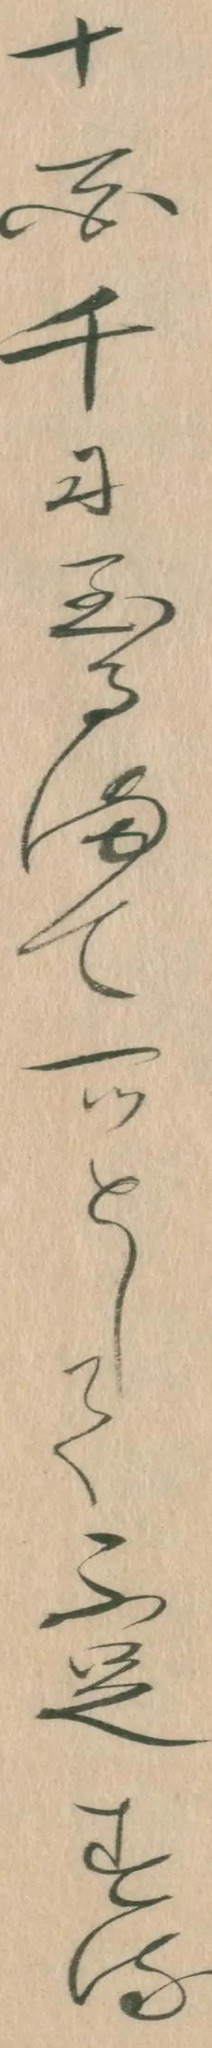十千に至るまて一ッとして不足する
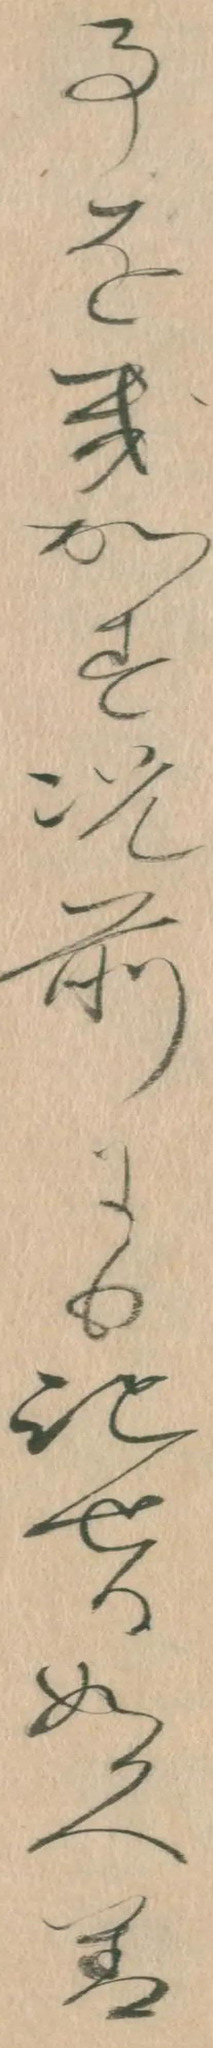事をきかす説前にも記せり如く善
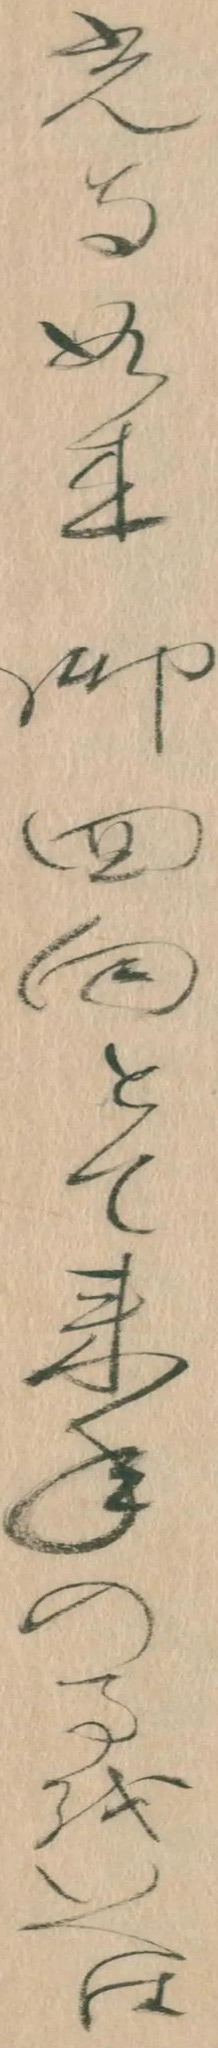光寺如来御回向とて来年の事をいへは
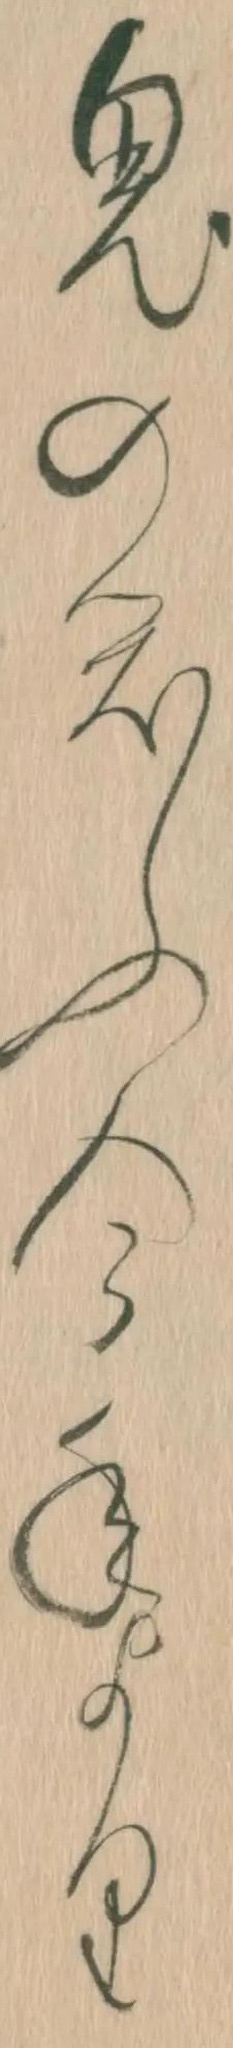鬼のふ今年より
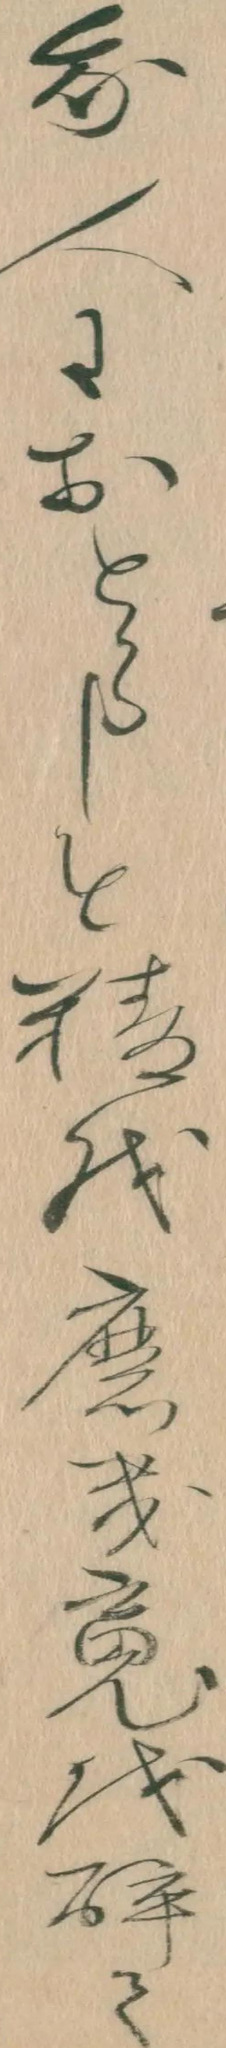我人におとらしと精を磨き魂を碎て
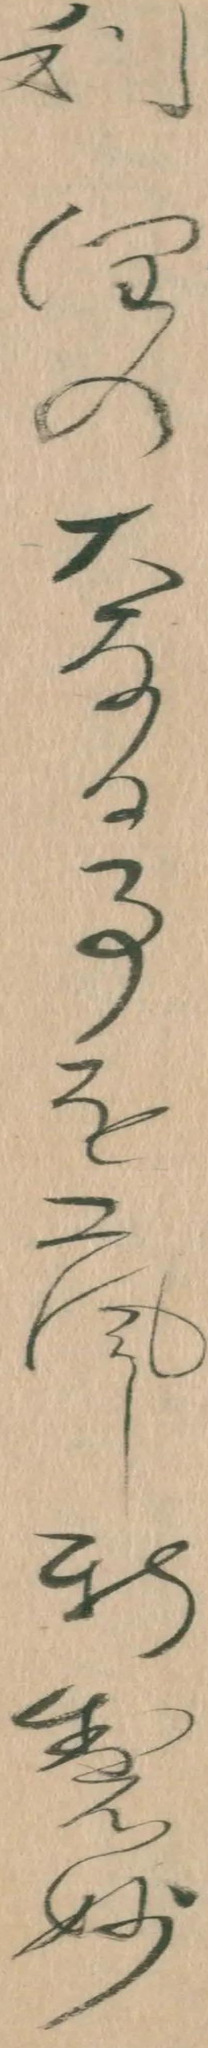利潤の大なる事を工風し新製妙
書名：俗語之種. [1]
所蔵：国立国会図書館 National Diet Library, JAPAN
